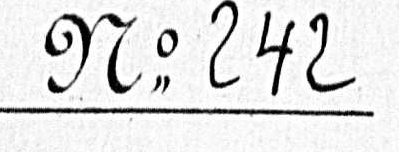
No. 242
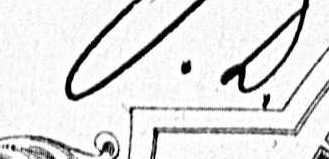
B.
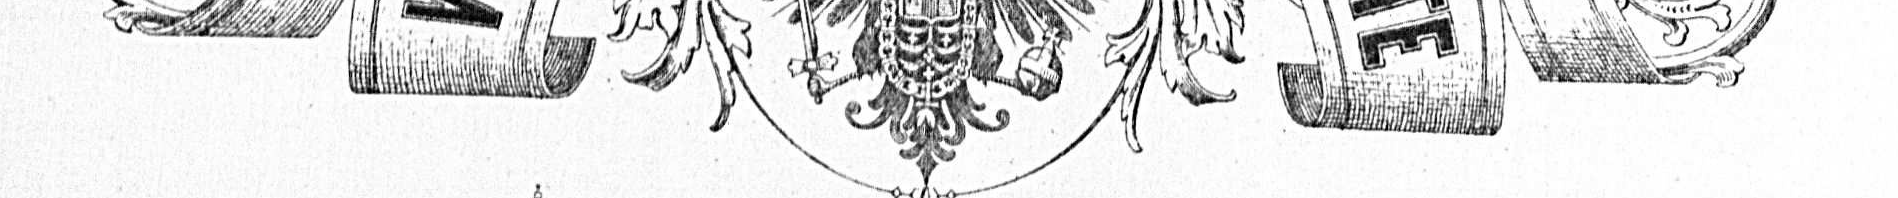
Vom k.und k. hof-telegraphen-amte
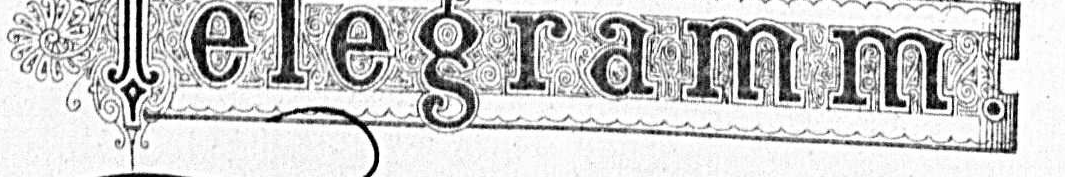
Telegramm
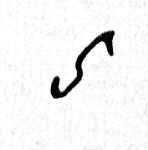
5
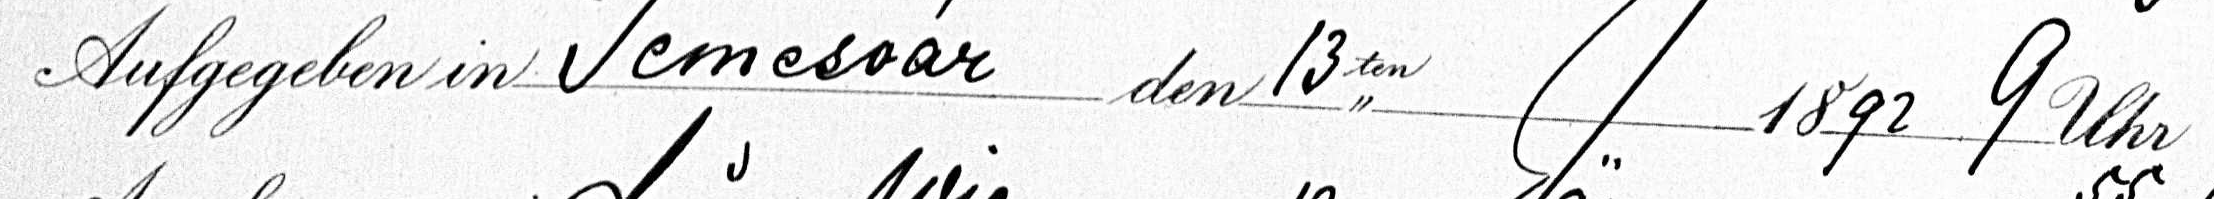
Aufgegeben in Temesvár den 13ten Jänner 1892 9 Uhr
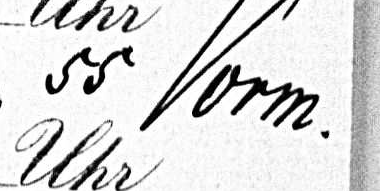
55 Vorm
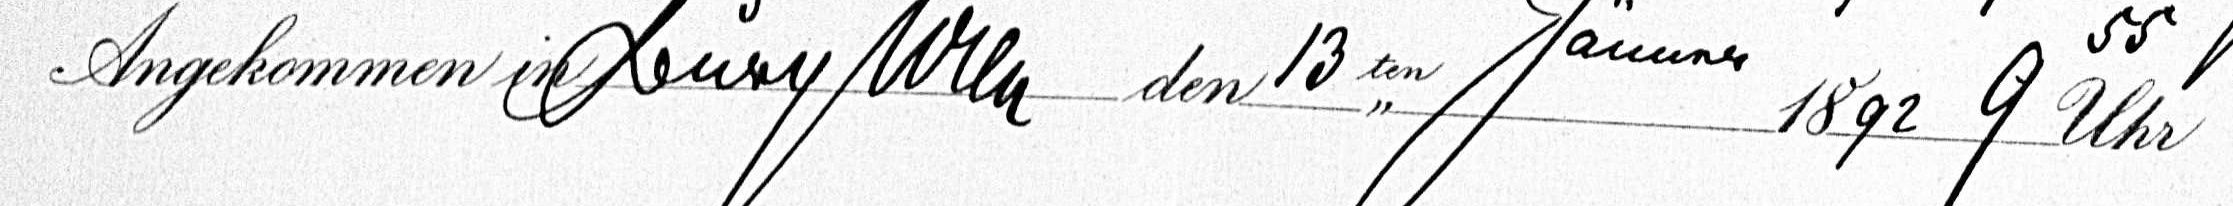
Angekommen in Burg Wien den 13ten Jänner 1892 9 Uhr
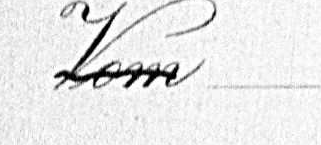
Vorm.
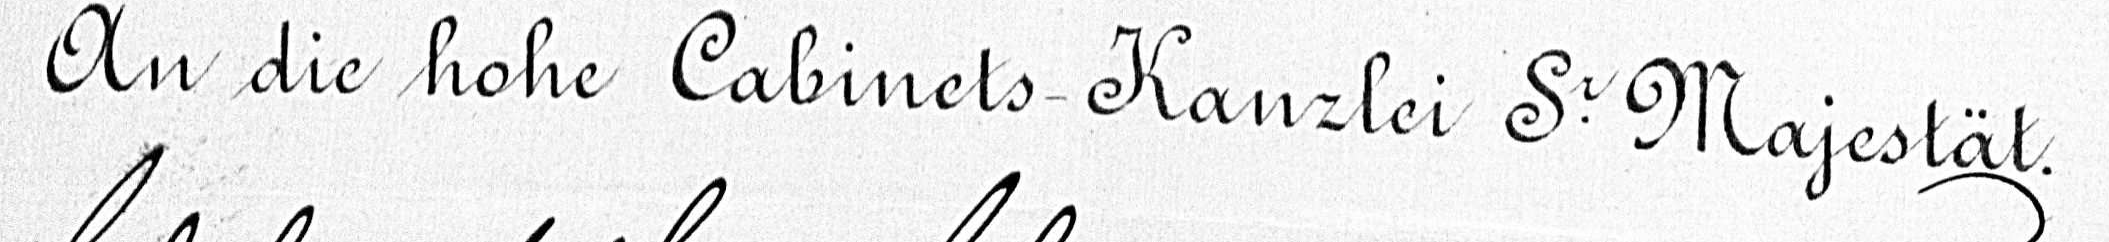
An die hohe Cabinets-Kanzlei Sr. Majestät
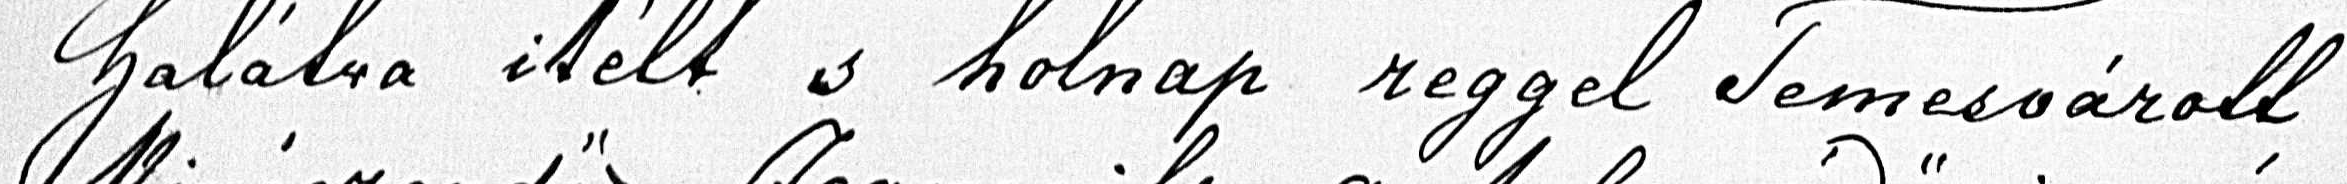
Halátra itélt s holnap reggel Temesvárott
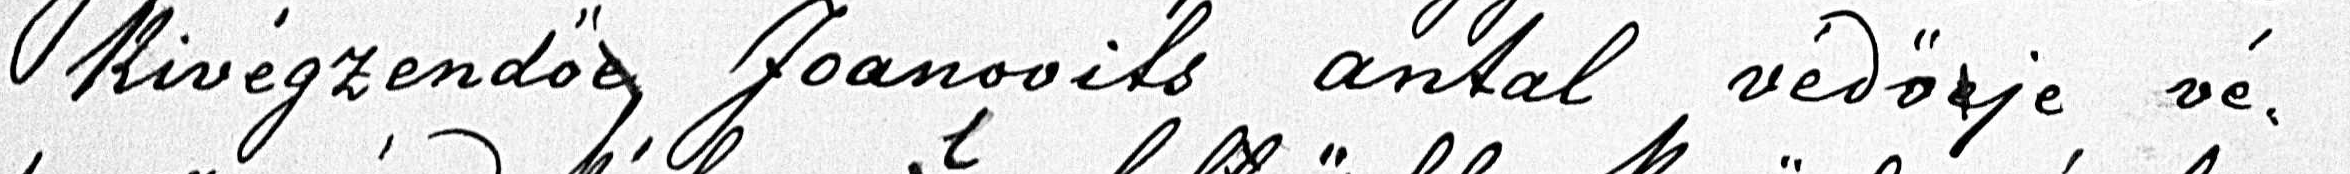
kivégzendőe Joanovits antal védője vé¬
